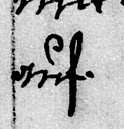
auf
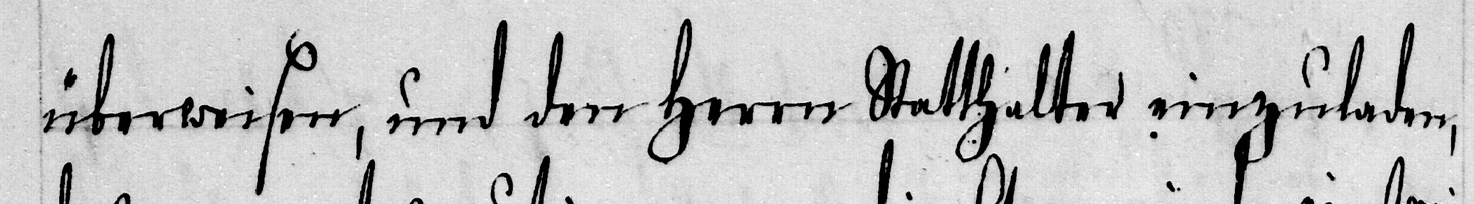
überweisen, und den Herrn Statthalter einzuladen,
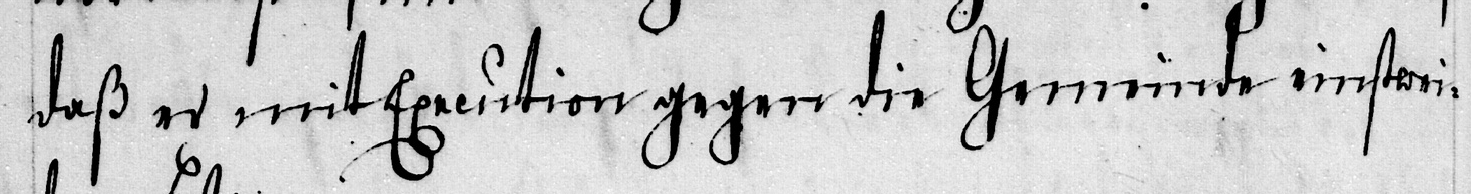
daß er mit Execution gegen die Gemeinde einstwei¬
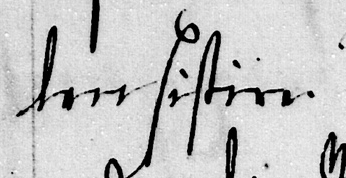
len sistire.
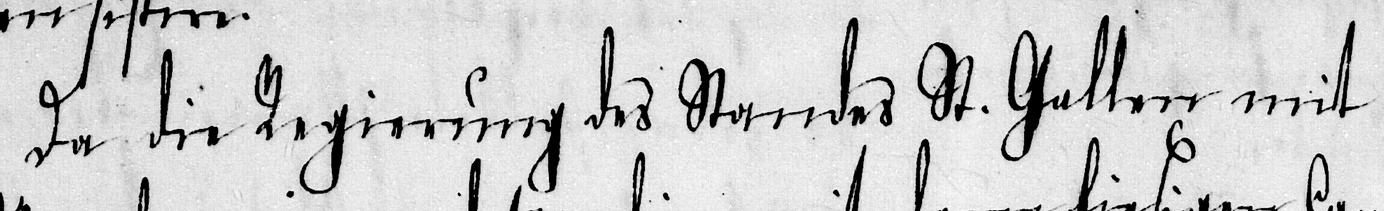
Da die Regierung des Standes St. Gallen mit
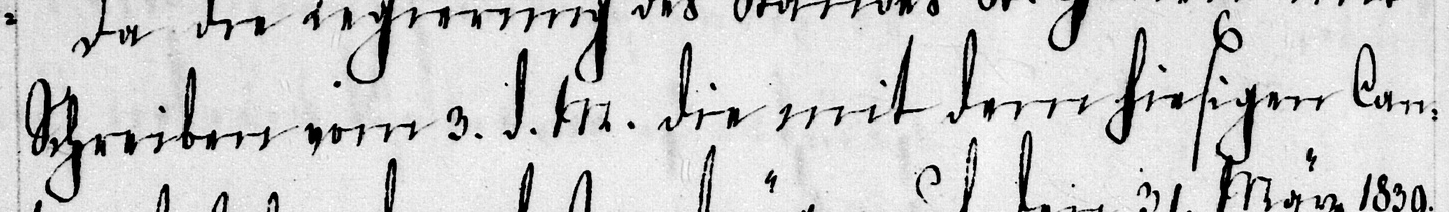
Schreiben vom 3. d. M. die mit dem hiesigen Can¬
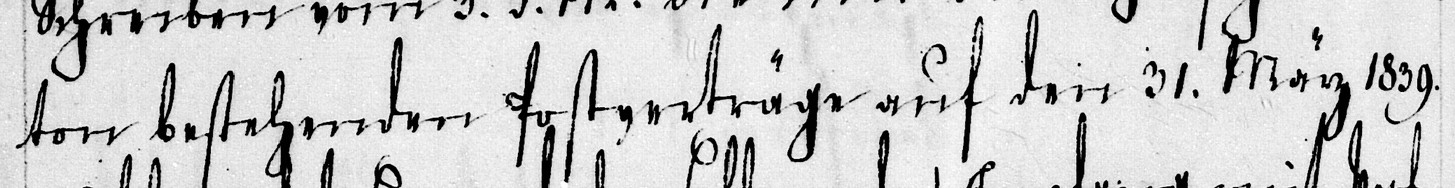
ton bestehenden Postverträge auf den 31. May 1839.
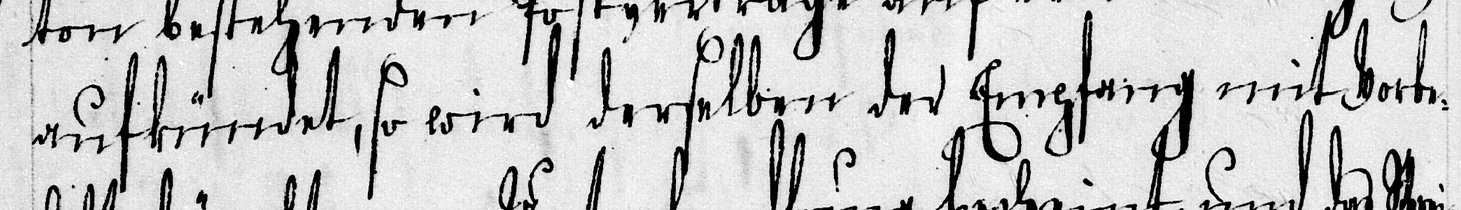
aufkündet, so wird derselben der Empfang mit Vorb¬
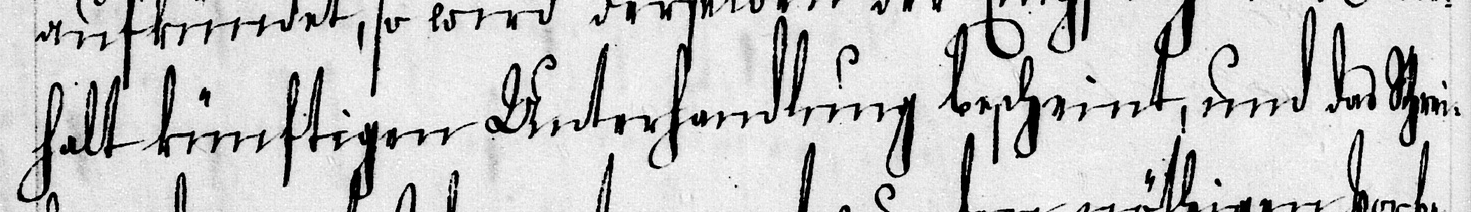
ehalt künftigen Unterhandlung bescheint, und das S¬
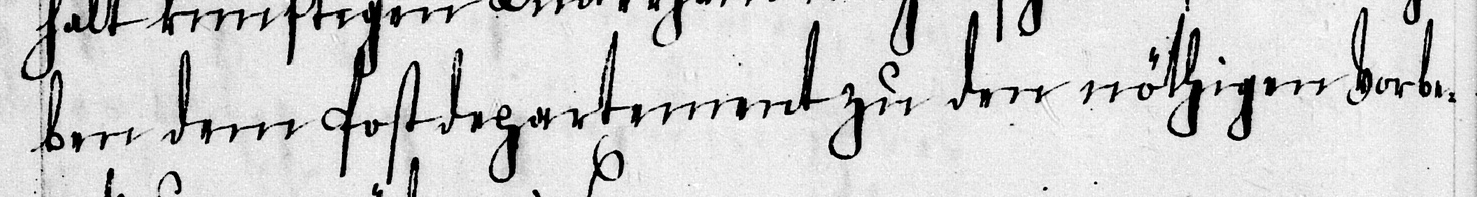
iben dem Postdepartement zu den nöthigen Vorbe¬
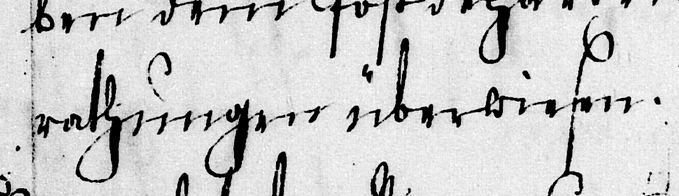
rathungen überwiesen.
